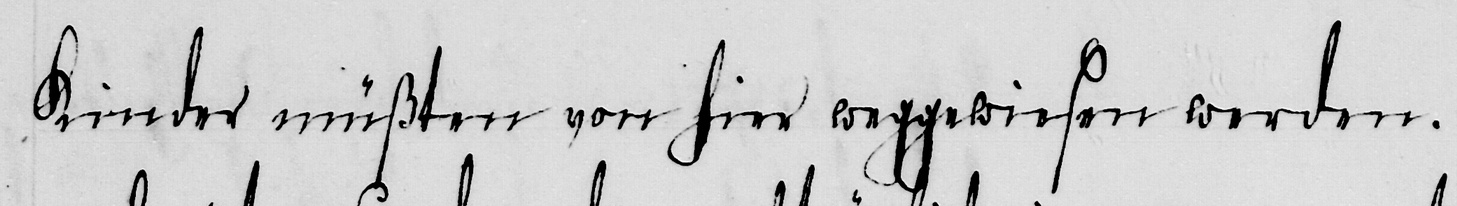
Kinder müßten von hier weggewiesen werden.
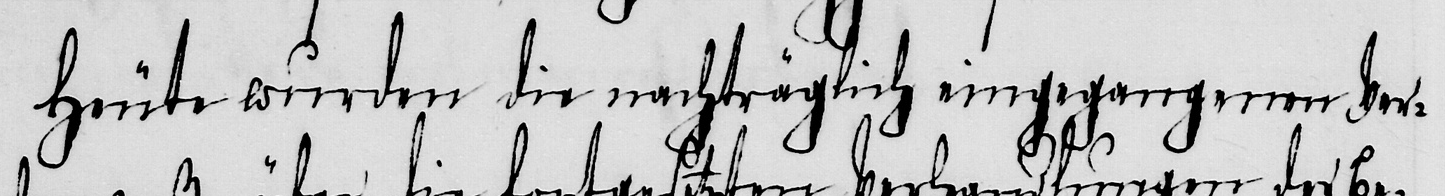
Heute wurden die nachträglich eingegangenen Ver¬
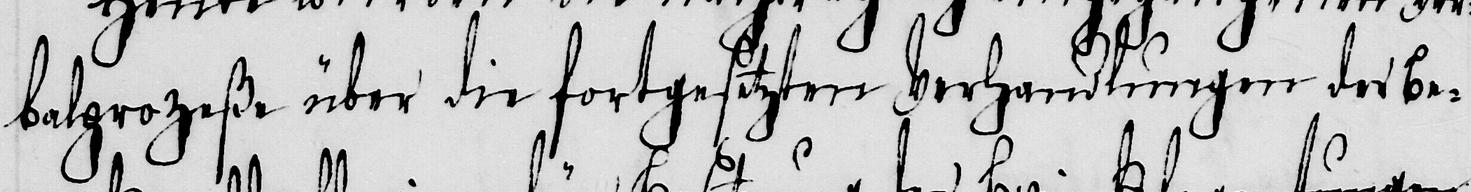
balprozeße über die fortgesetzten Verhandlungen der Be¬
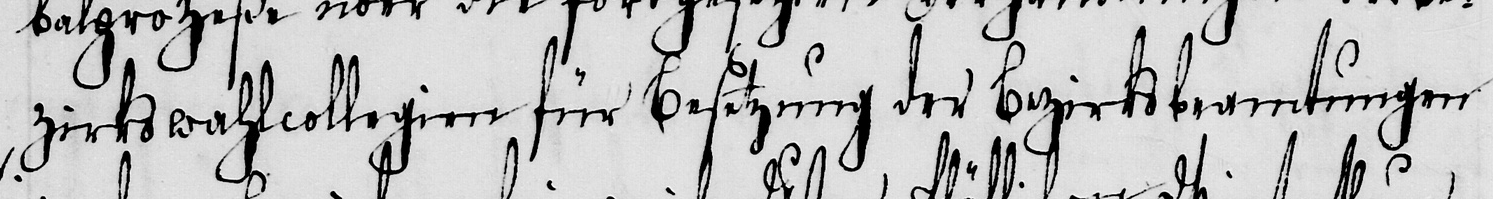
zirkswahlcollegien für Besetzung der Bezirksbeamtungen
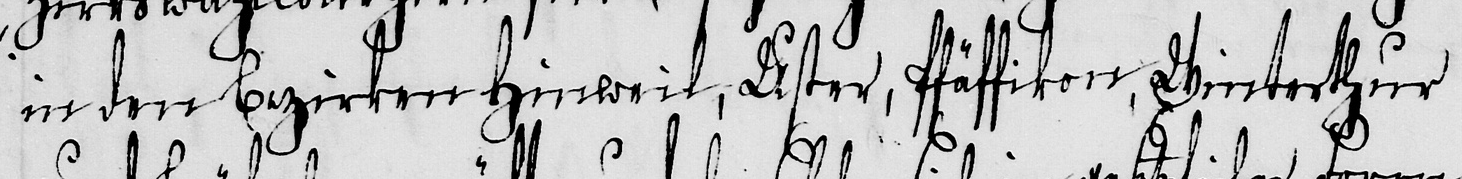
in den Bezirken Hinweil, Uster, Pfäffikon, Winterthur
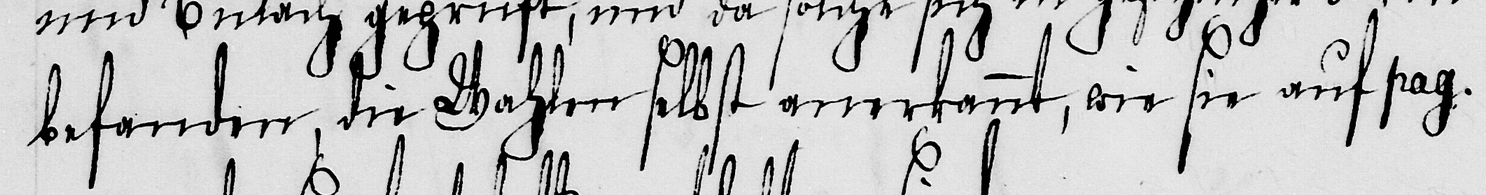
befanden, die Wahlen selbst anerkannt, wie sie auf pag.
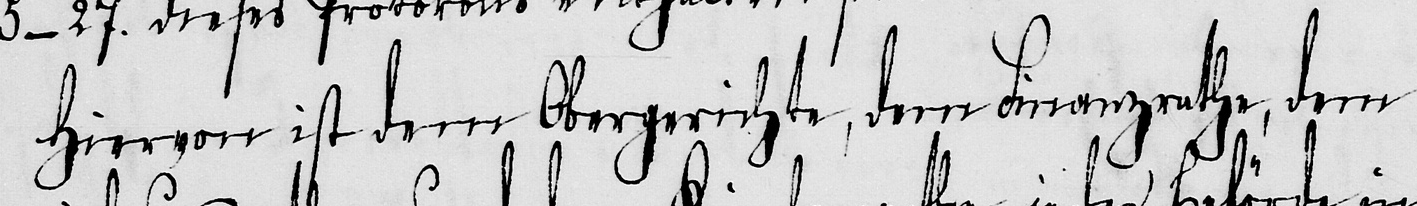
Hiervon ist dem Obergerichte, dem Finanzrathe, dem
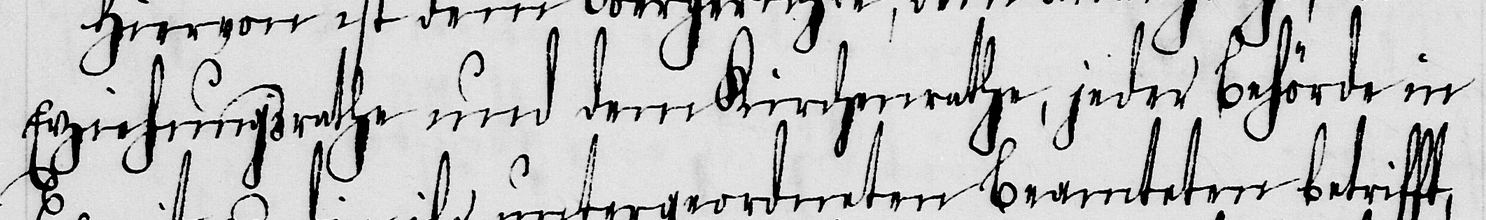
Erziehungsrathe und dem Kirchenrathe, jeder Behörde in
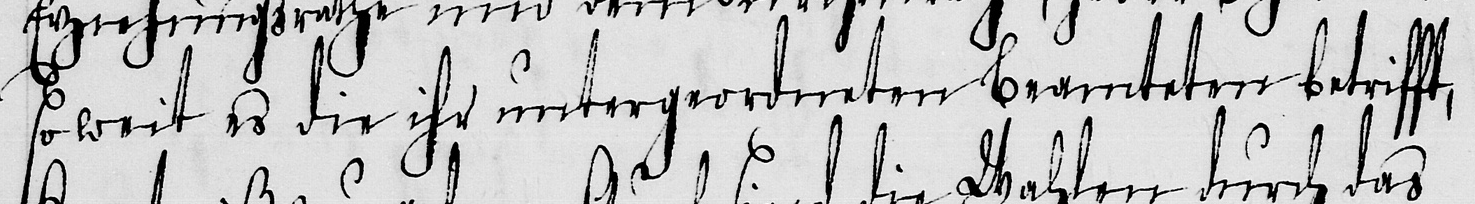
soweit es die ihr untergeordneten Beamteten betrifft,
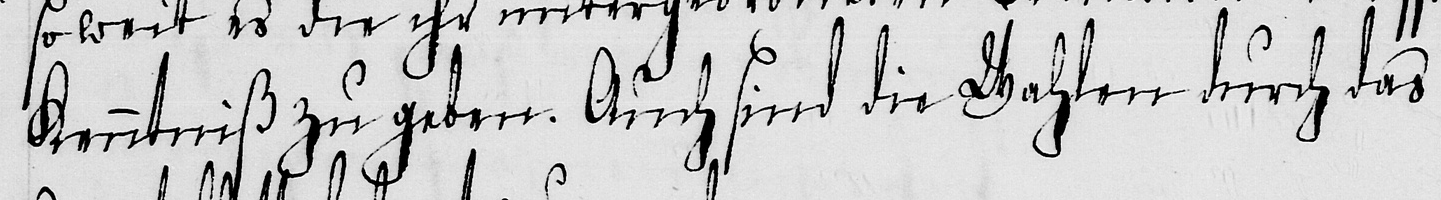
Kenntniß zu geben. Auch sind die Wahlen durch das
